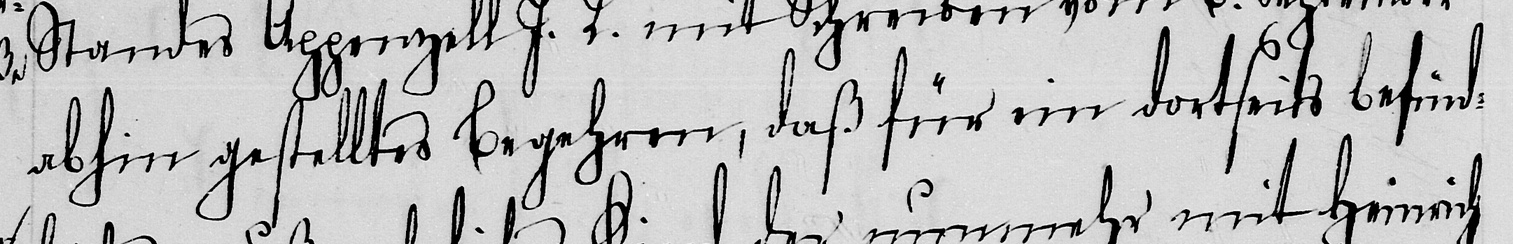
abhin gestelltes Begehren, daß für ein dortseits befin¬
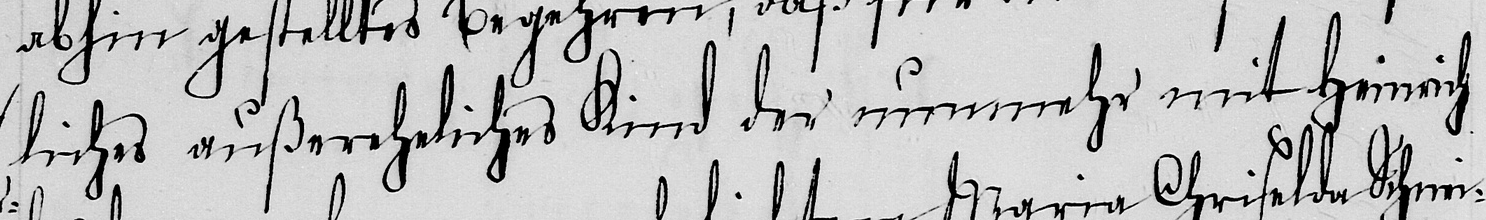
dliches außereheliches Kind der nunmehr mit Heinrich
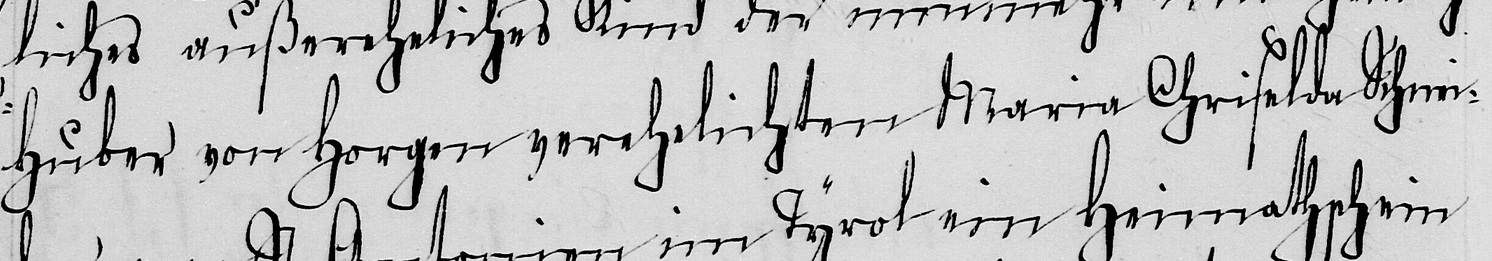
Huber von Horgen verehelichten Maria Chriselda Schne¬
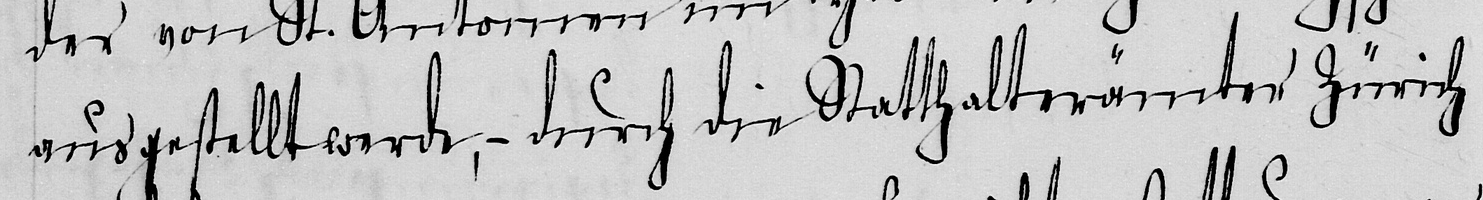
ausgestellt werde, – durch die Statthalterämter Zürich
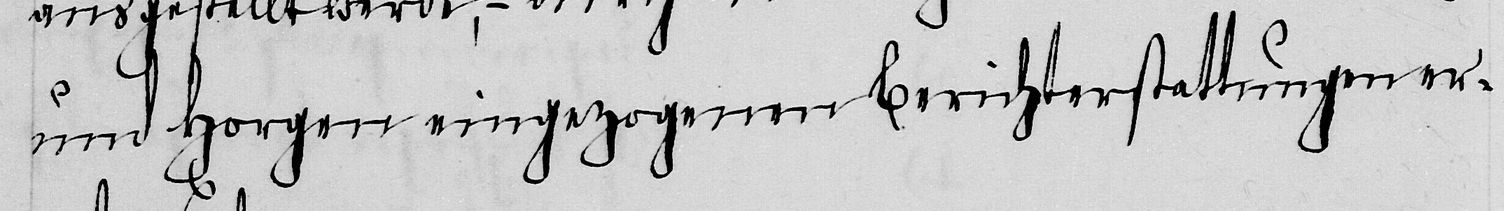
und Horgen eingezogenen Berichterstattungen er¬
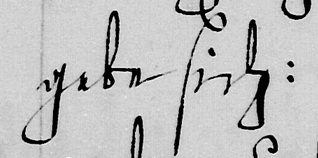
gebe sich:
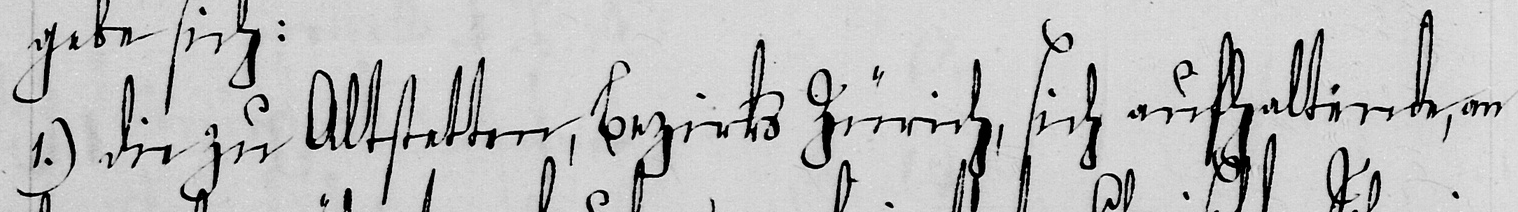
1.) die zu Altstetten, Bezirks Zürich, sich aufhaltende,
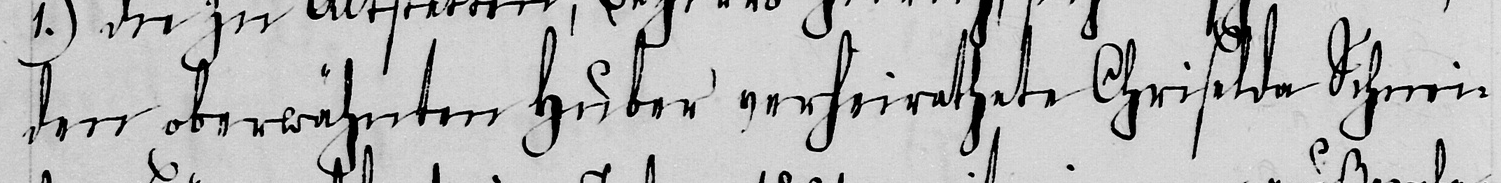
den oberwähnten Huber verheirathete Chriselda Schnei¬
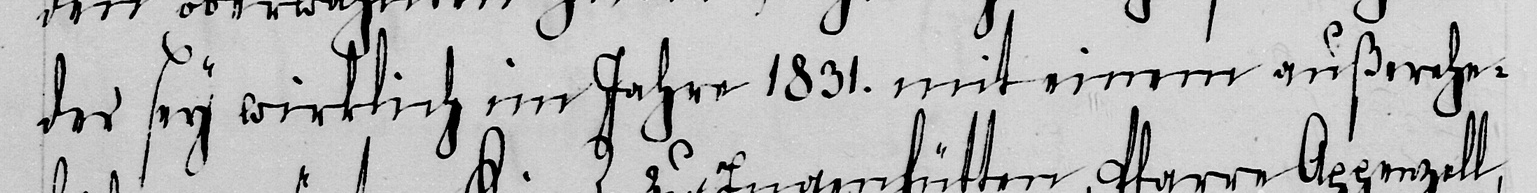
der sey wirklich im Jahre 1831. mit einem außerehe¬
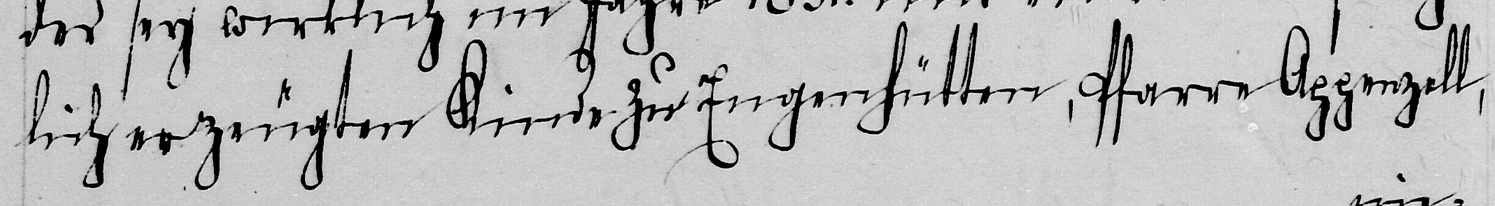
lich erzeugten Kinde zu Engenhütten, Pfarre Appenzel¬
